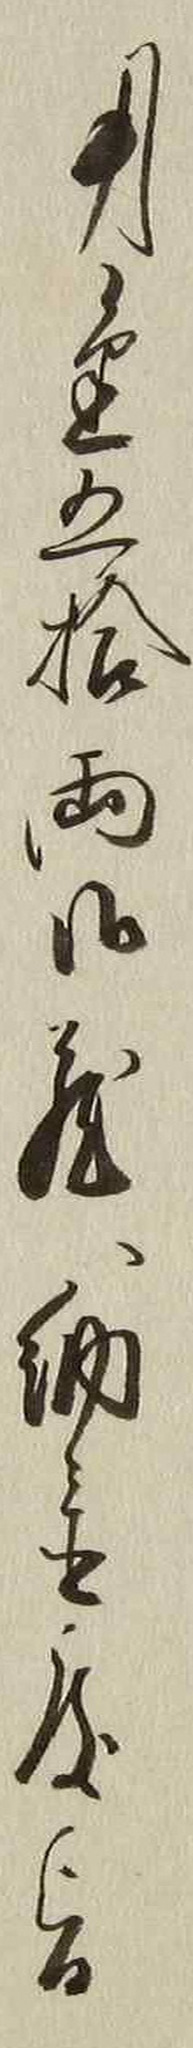用金五拾両御蔵へ納置度旨
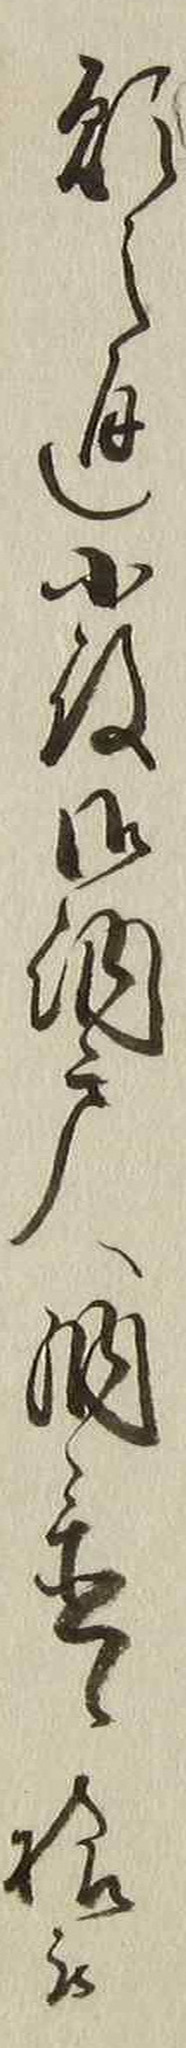願之通小役御納戸へ納置候様被
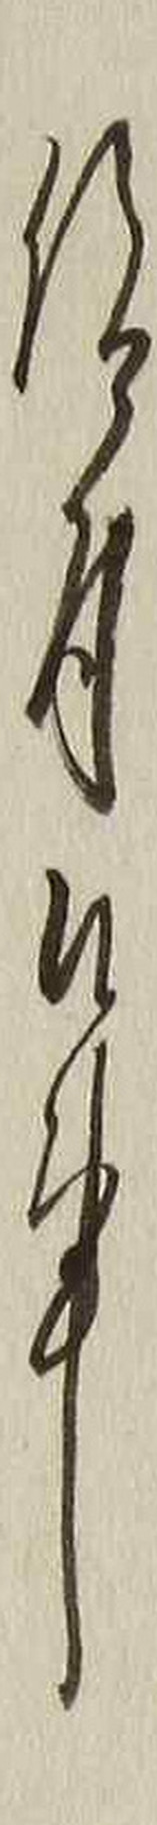仰付候事
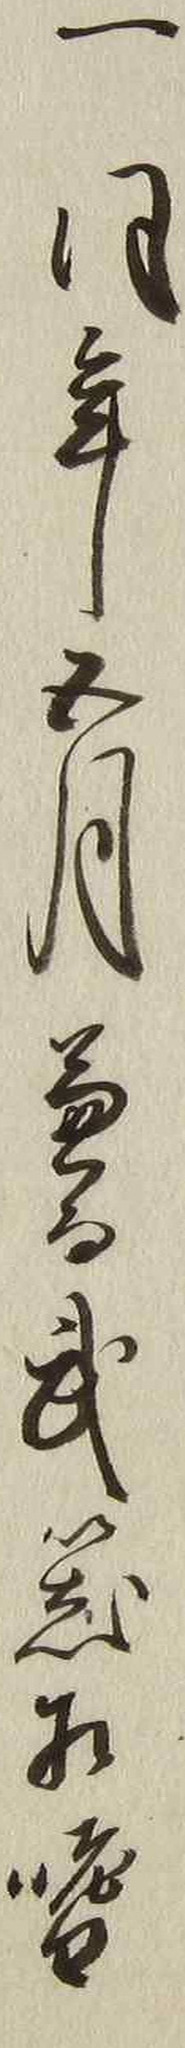一同年五月兼而武器相嗜
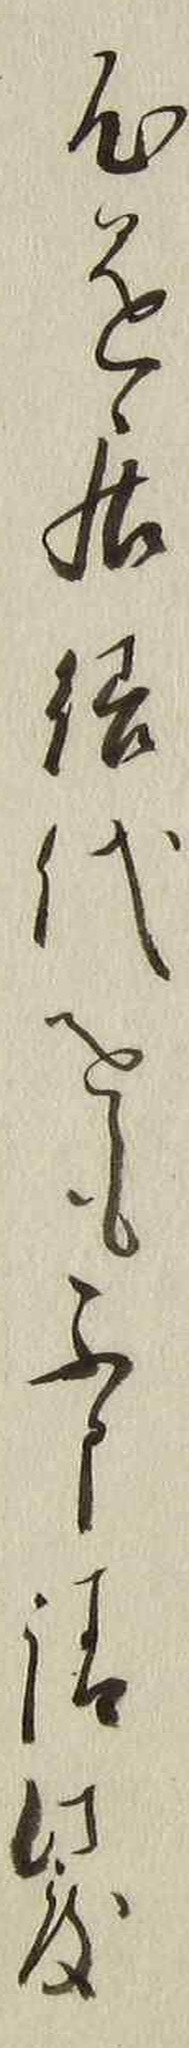心懸居繕代をも不申請此度
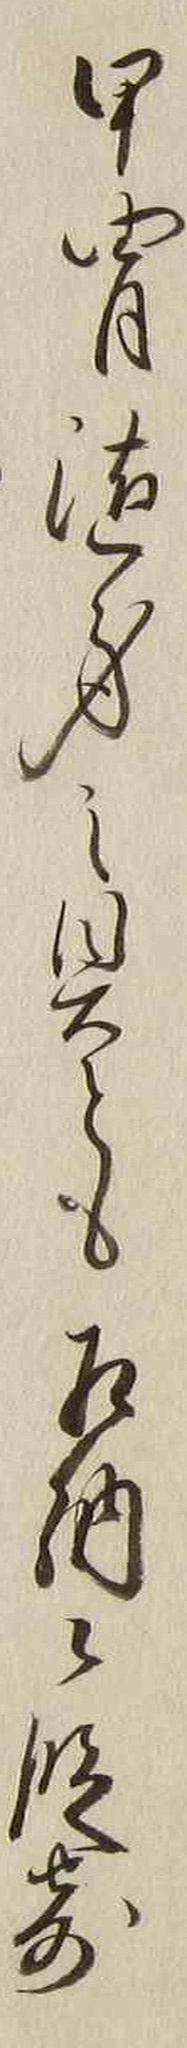甲冑随身之具とも相納候段寄
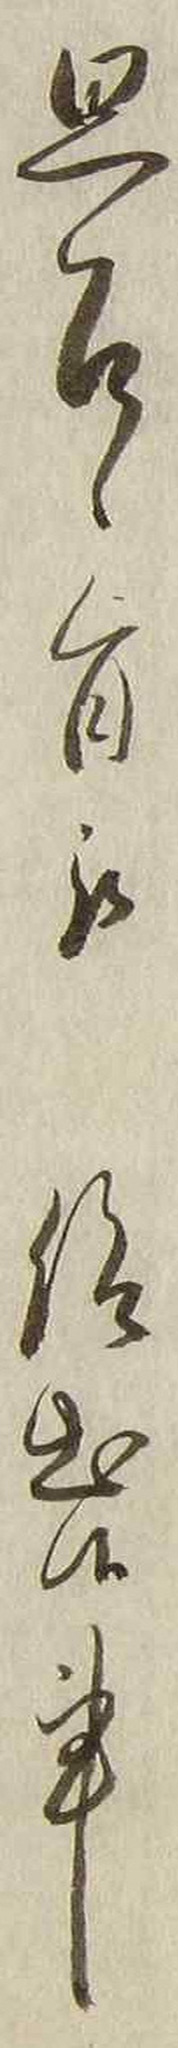思召候旨被仰出候事
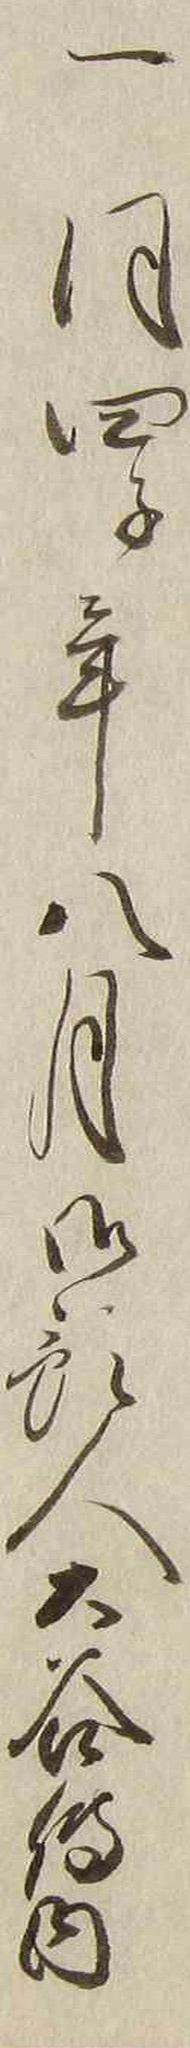一同四子年八月御預人大谷伝内

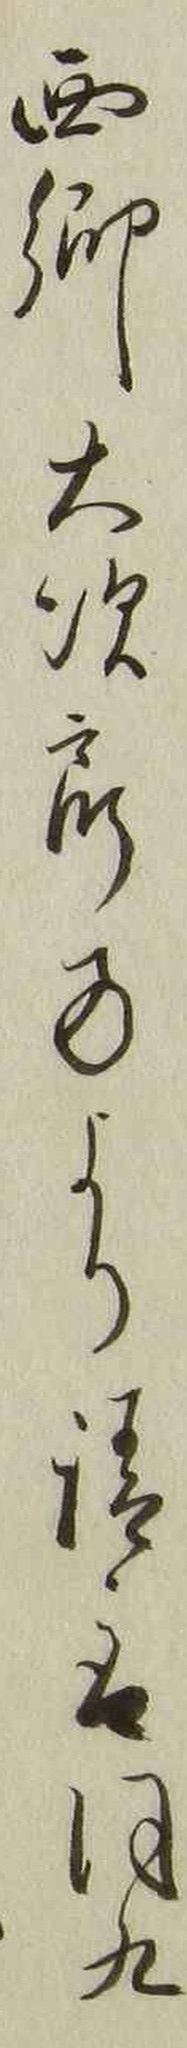西郷大次郎方より請取同九
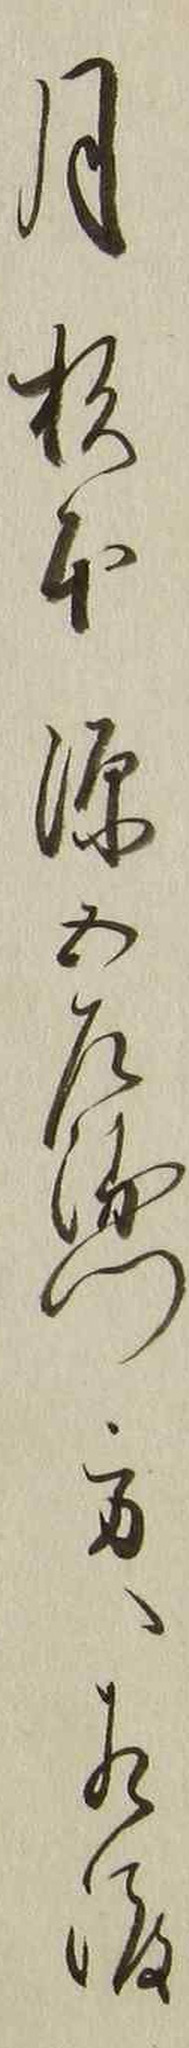月杉本源五左衛門方へ相渡
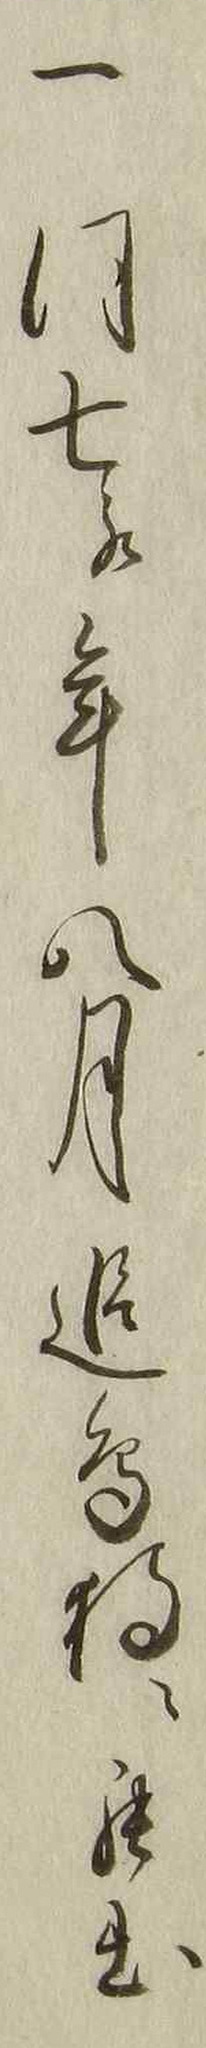一同七卯年八月追鳥狩ニ罷出
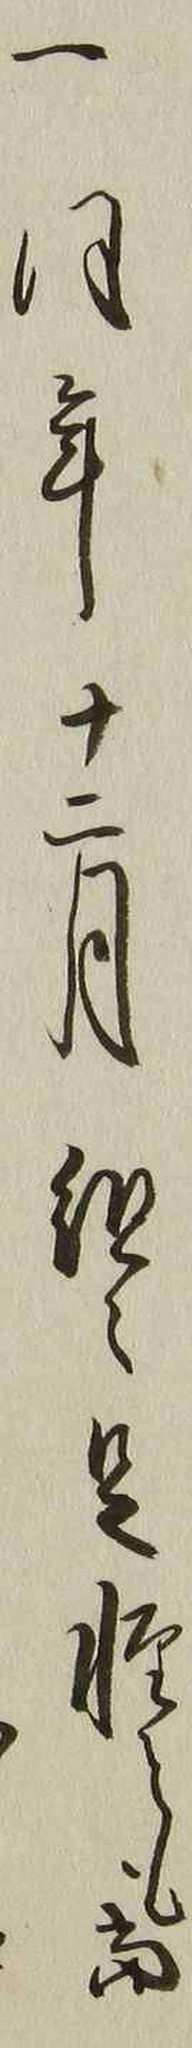一同年十二月組之足軽とも当
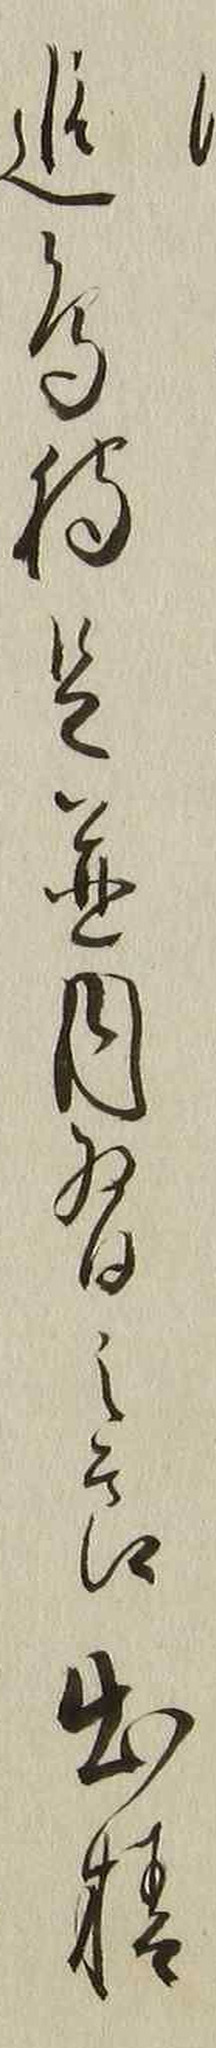追鳥狩足軽並内習之節出精
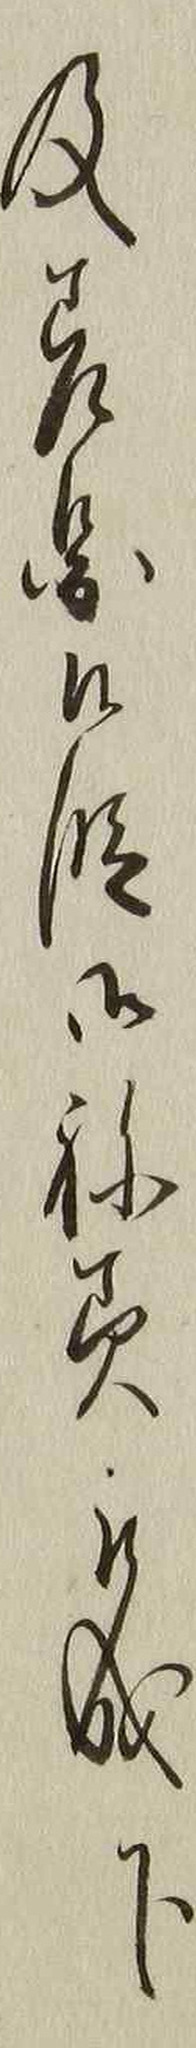及差図候段御称美被成下
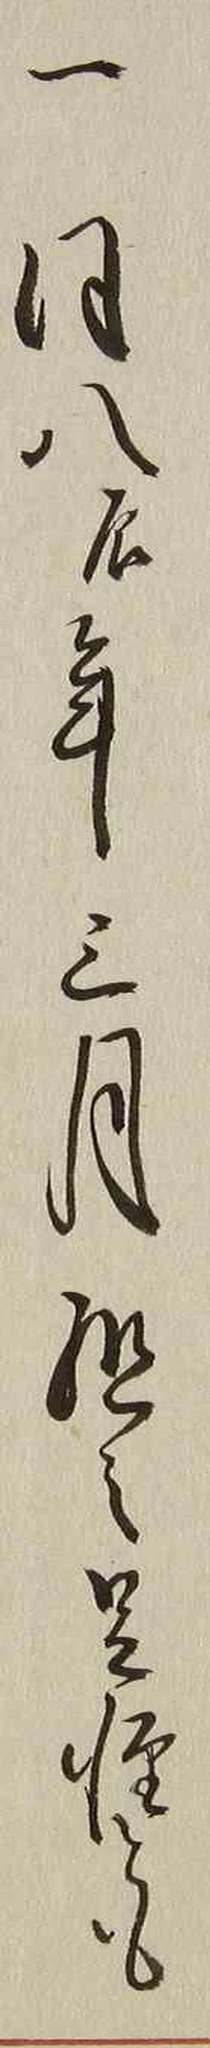一同八辰年三月組之足軽とも
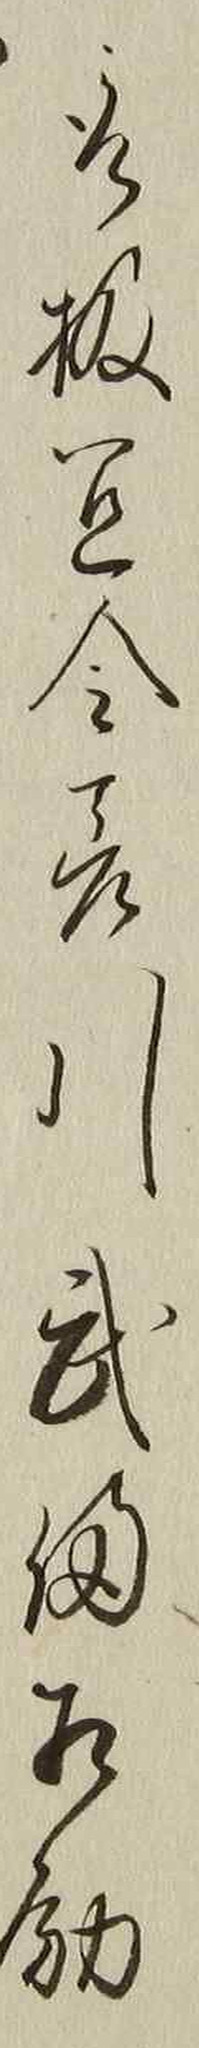取扱宜令差引武備相励
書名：諸士系譜　巻之18　い之部18
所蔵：会津若松市立会津図書館
